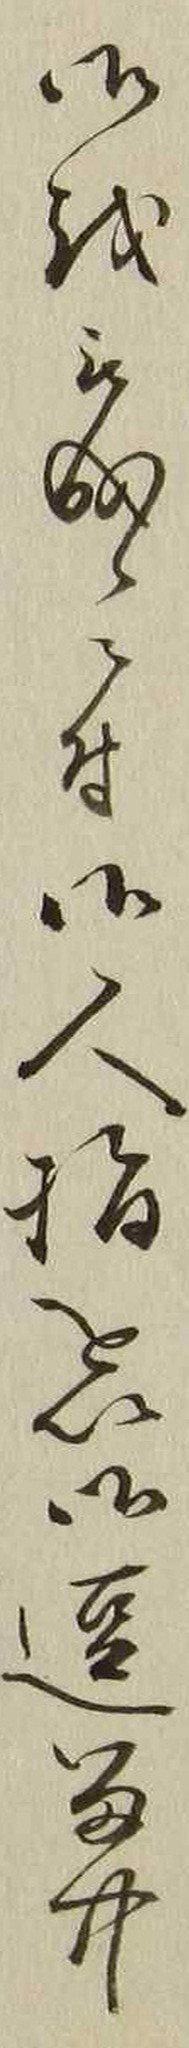御越被成候ニ付御人指を以御逗留中
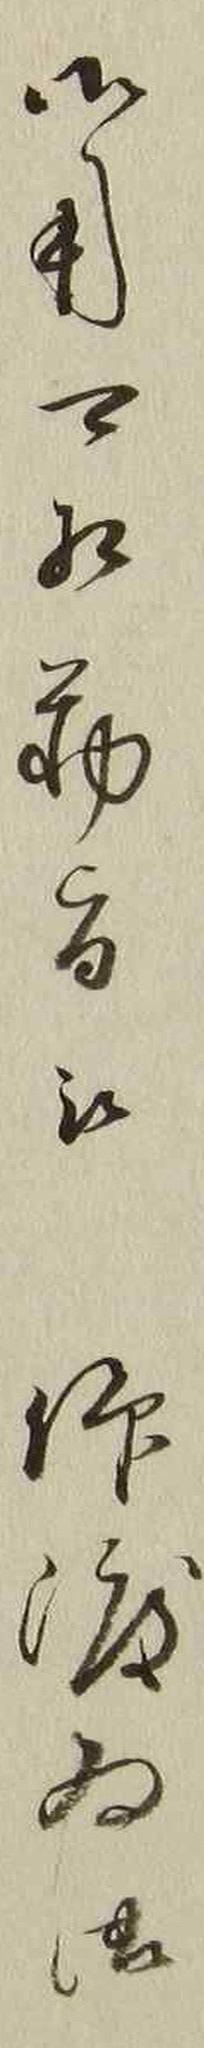御用可相勤旨被仰渡為御
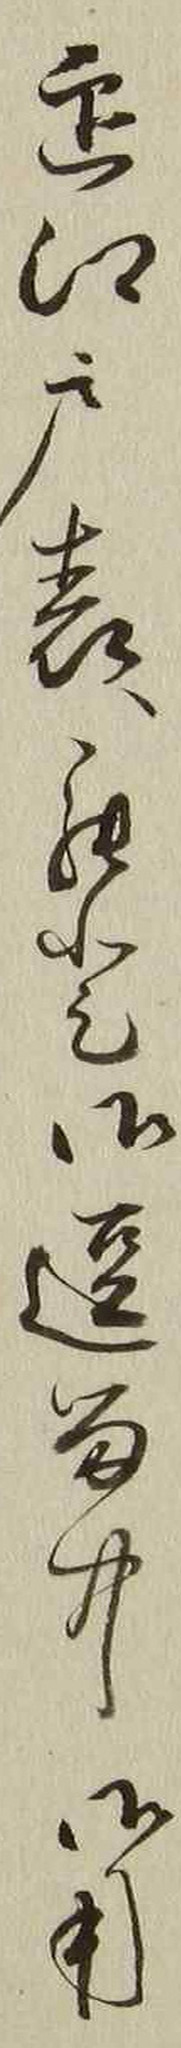迎江戸表へ罷登御逗留中御用
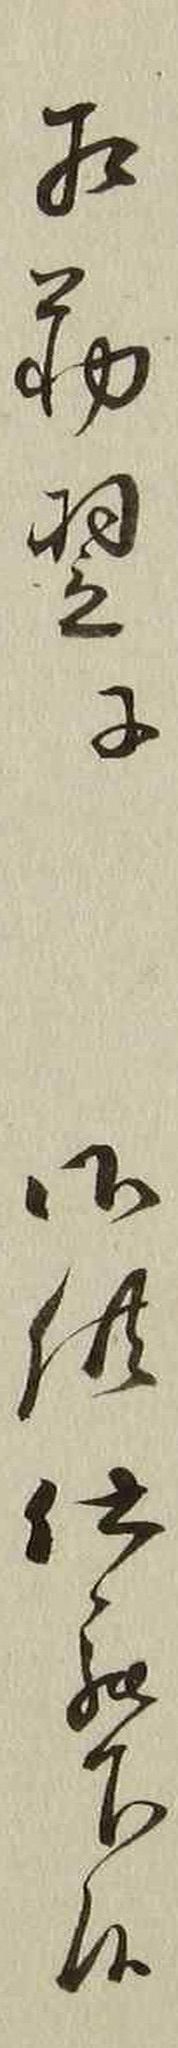相勤翌子御供仕罷下候
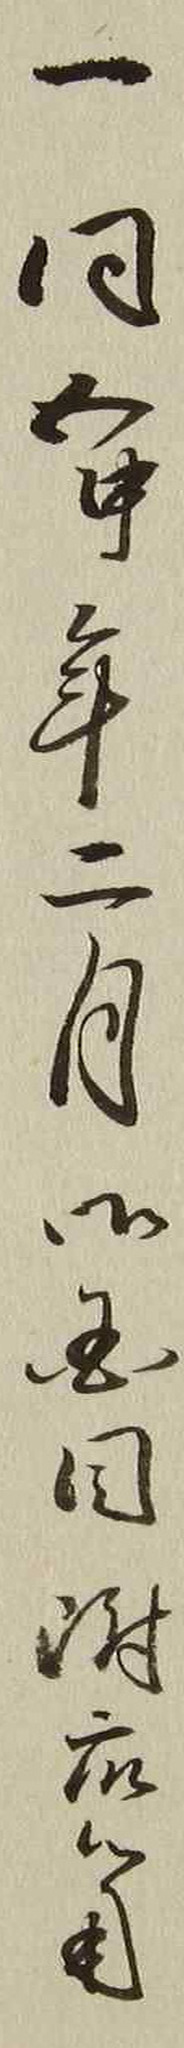一同五申年二月御国目附衆御用
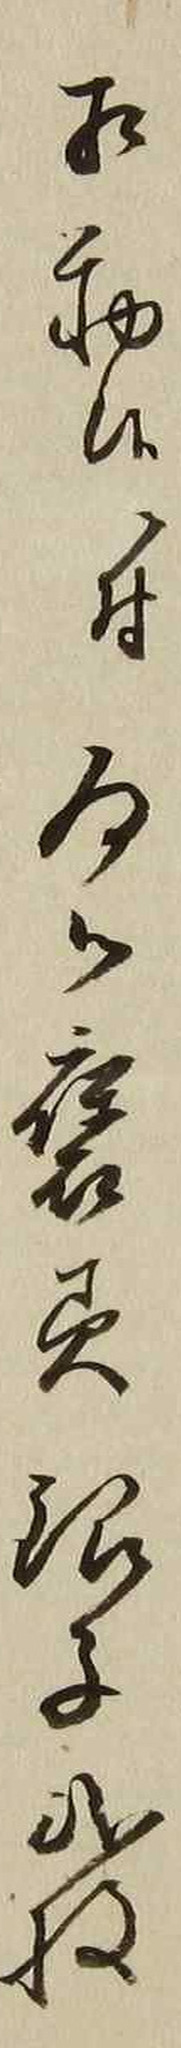相勤候ニ付為御褒美銀子弐枚
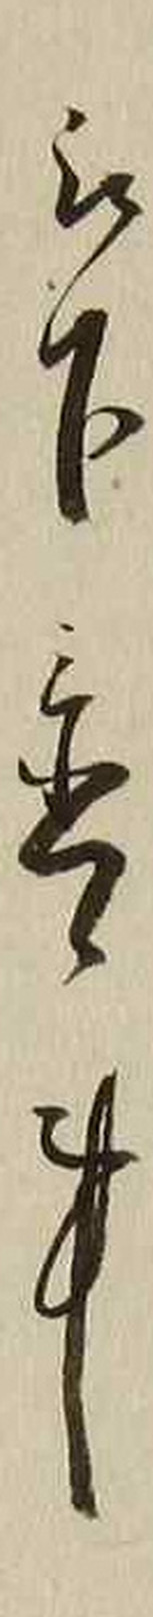被下置候事
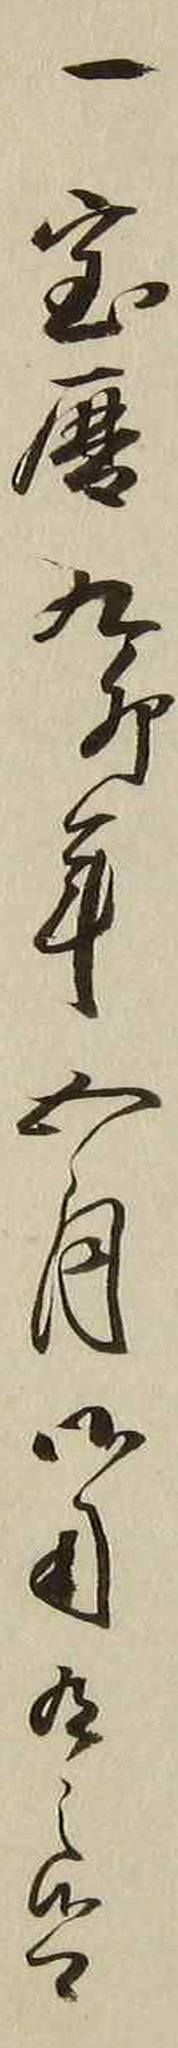一宝暦九卯年五月御用有之候ハヽ
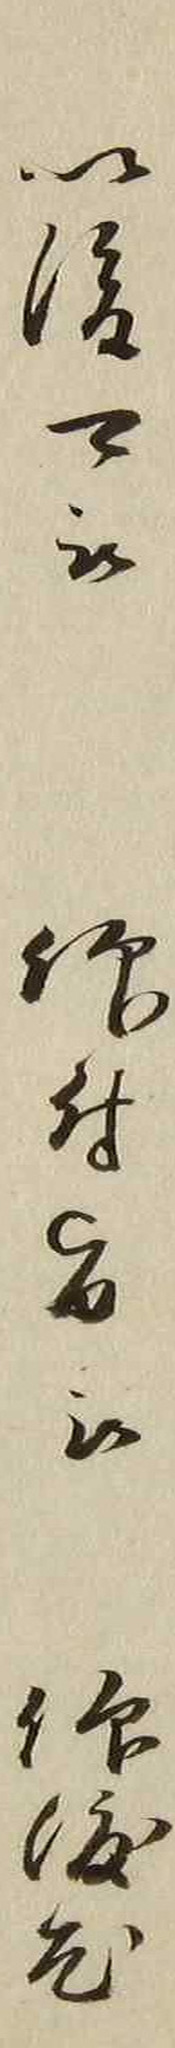以後可被仰付旨被仰渡尤
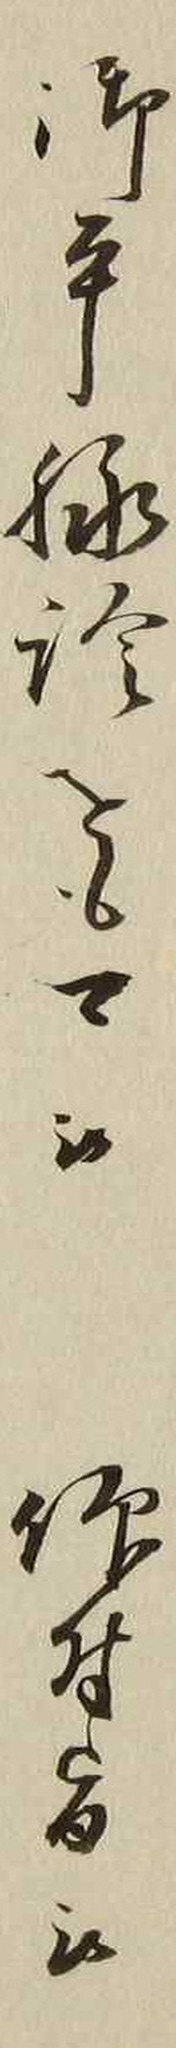御平脈診をも可被仰付旨被
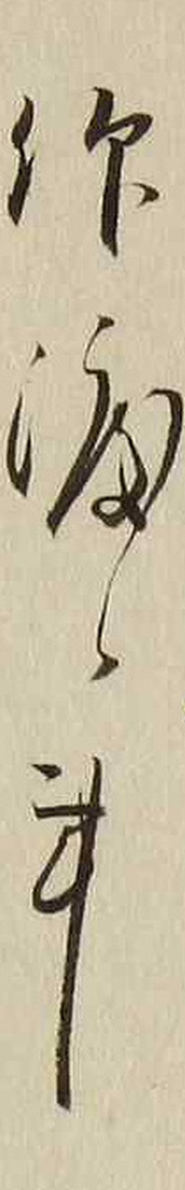仰渡候事
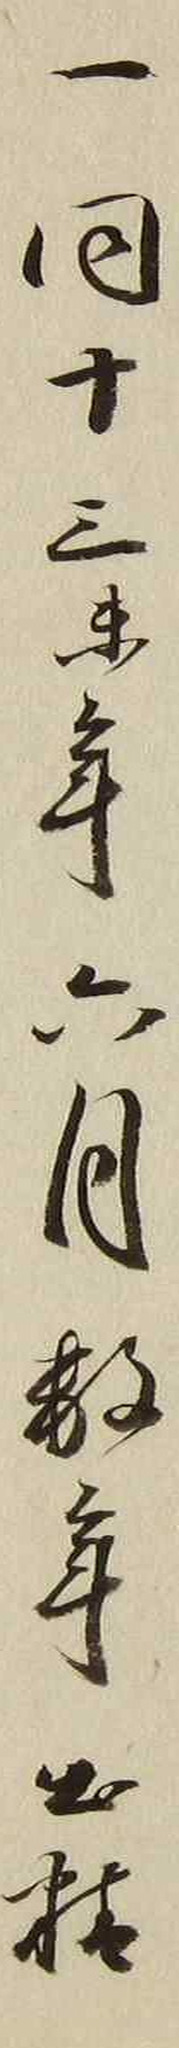一同十三未年六月数年出精
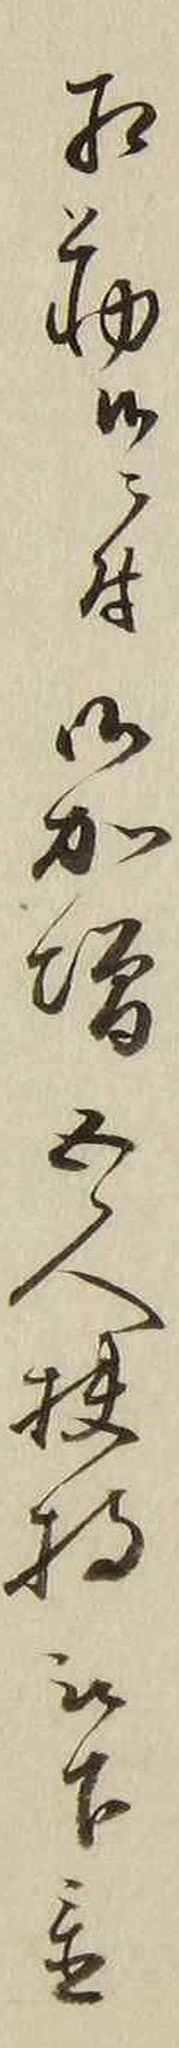相勤候ニ付御加増五人扶持被下置
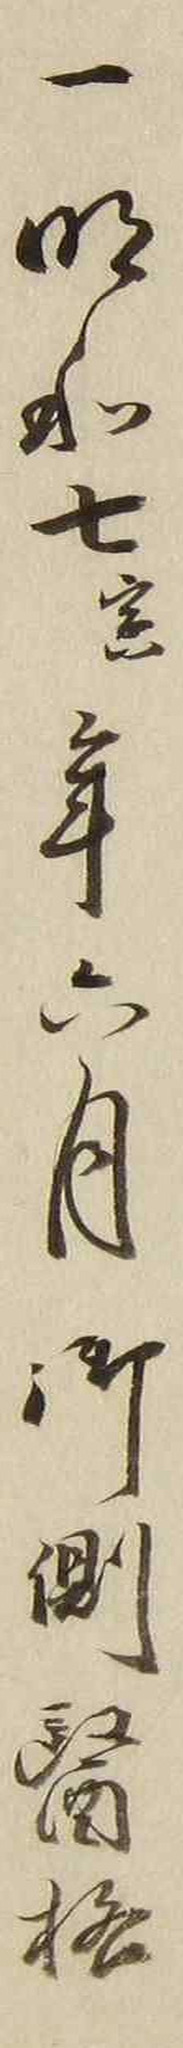一明和七寅年六月御側医格

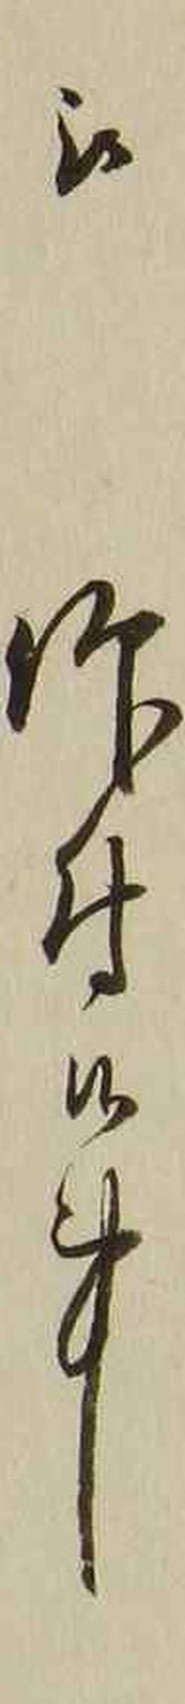被仰付候事
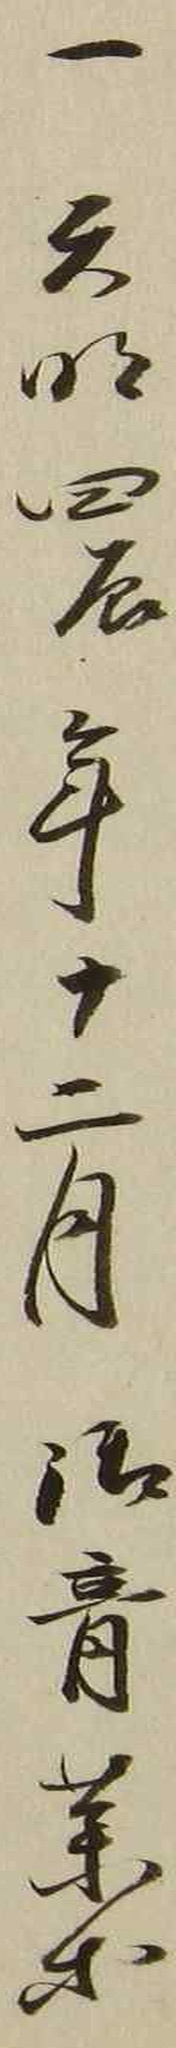一天明四辰年十二月御膏薬等
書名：諸士系譜　巻之52　に之部3
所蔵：会津若松市立会津図書館
